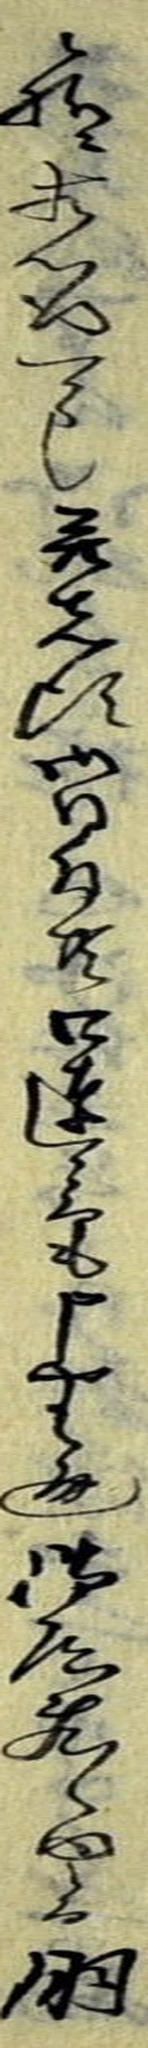候様に相心得可申候并先頃御目付共へ口達に而も申聞候通御屋敷之内に而朋
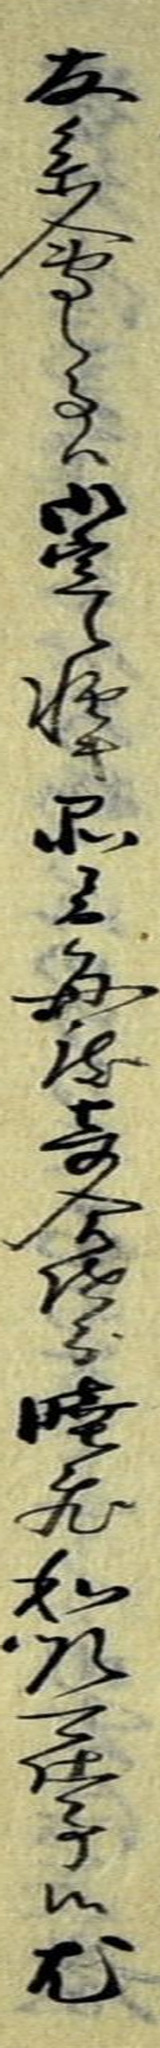友参会之事は御定之軽き品に而毎度寄合随分睦敷和順可仕事候尤
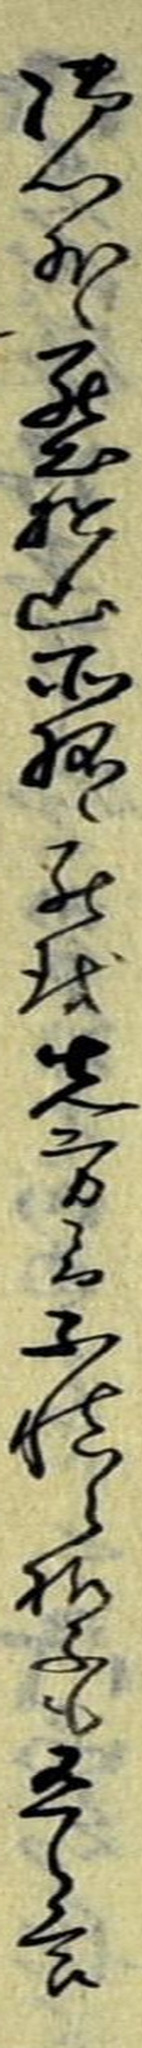御心外之罷出遊山所抔へ罷越先方に而不慎之様子も有之節

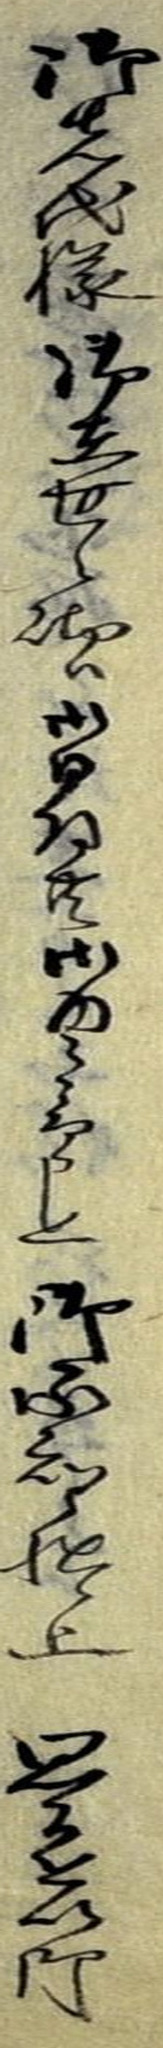御先代様御在世之砌は御目付共御内々に而申上御承知被遊候上思召を以御
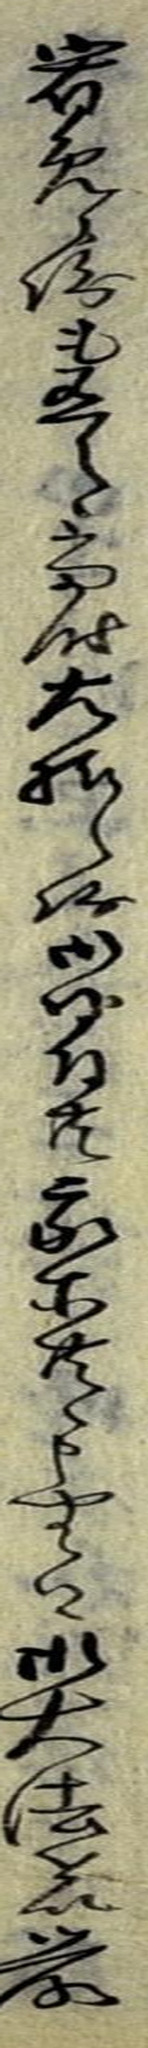宥免之儀も有之候当時左様之儀御目付共我等共へ申聞候はゝ御大法を以厳
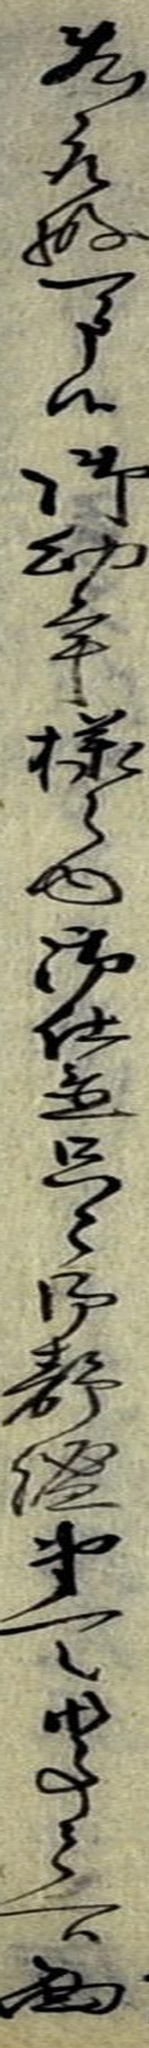敷取扱可申候御幼年様之内御仕置只々御静謐第一之御事に候へは面
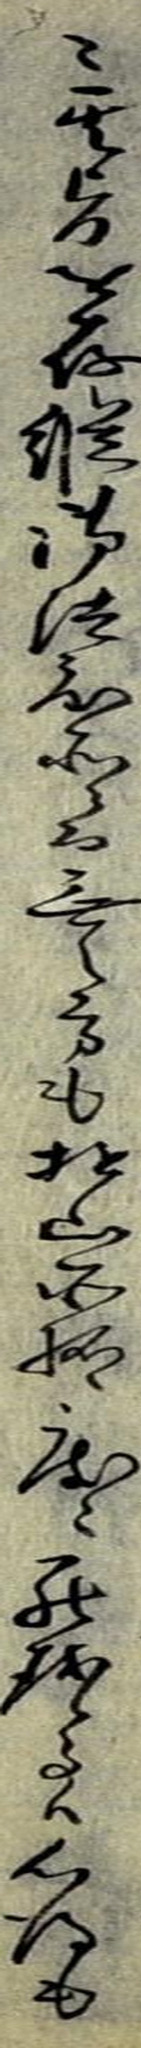々其旨を存縦御法度所に而無之方も遊山所抔へ度々罷越候事は心得も
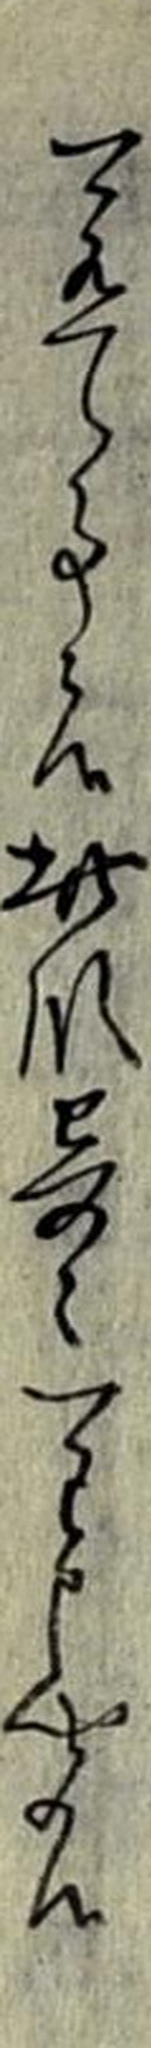可有之事に候此段寄々可被申聞候
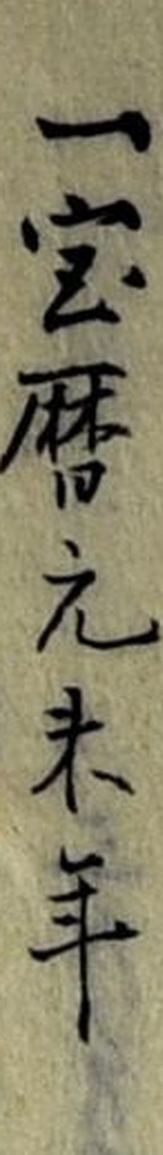一宝暦元未年
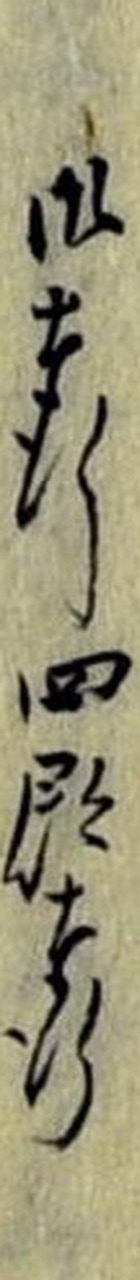御奉行四郡奉行
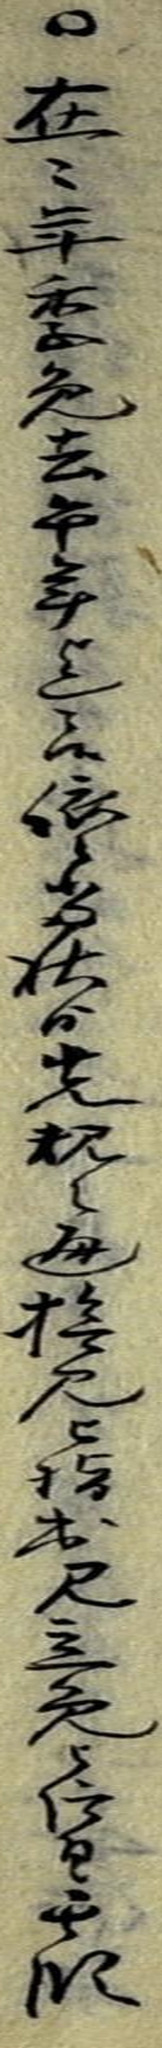〇在々年季免去午年迄に候依之当秋ゟ先規之通検見被指出見立免被仰付候其段
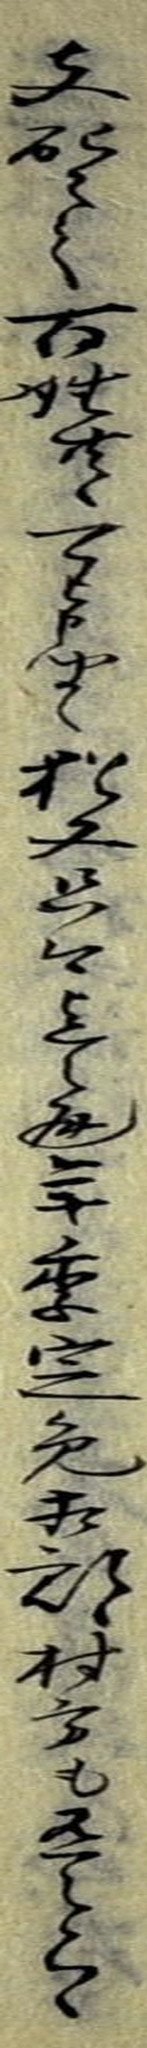支配々々之百姓共へ可被申聞候猶又只今迄之通年季定免相願候村方も有之候はゝ
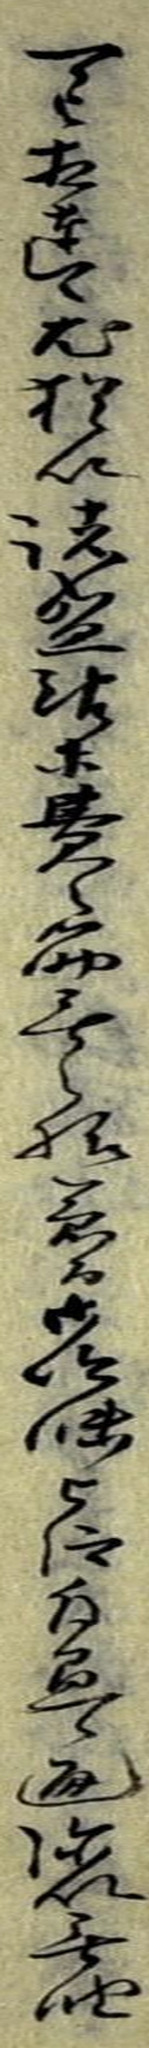可被相達候尤猶以諸盛銀等費之筋無之様兼而御吟味被仰付置候通弥以無油
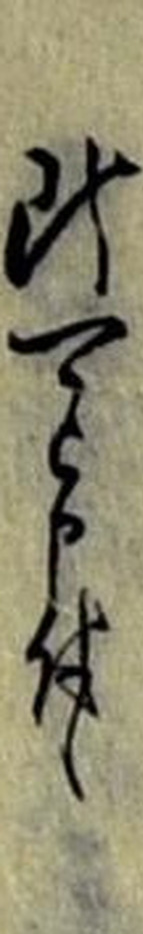断可被申付候
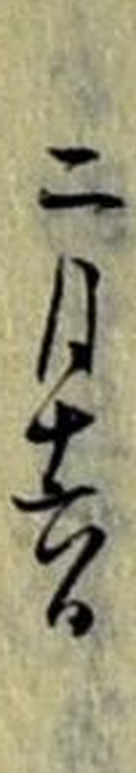二月十六日

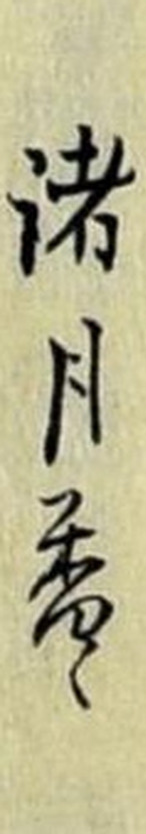諸月番へ
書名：命令之部 二
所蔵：福井県文書館 Fukui Prefectural Archives
